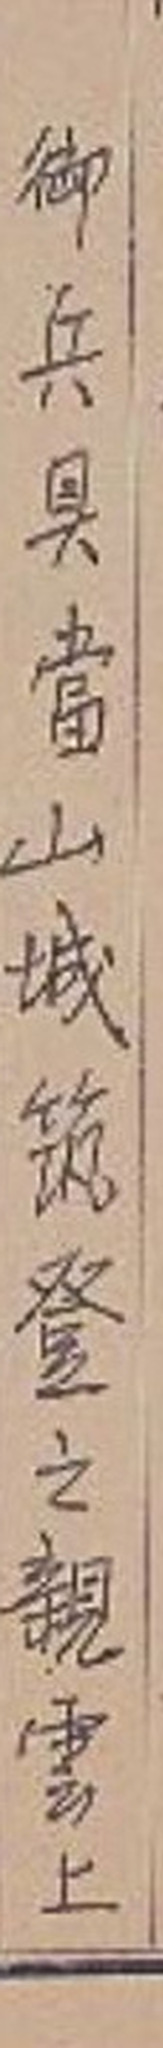御兵具当山城筑登之親雲上
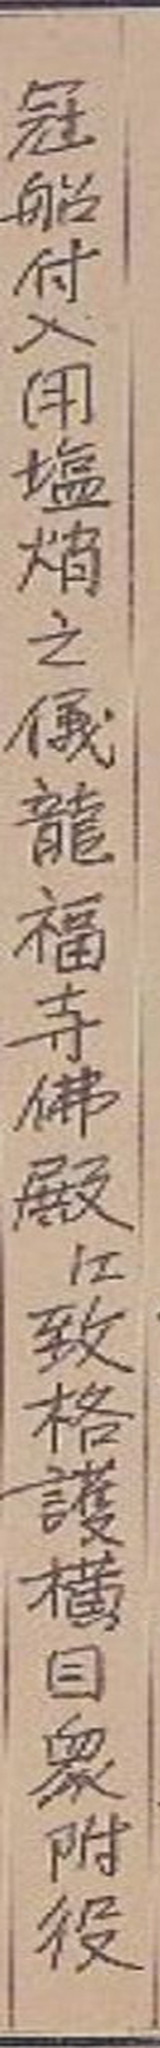冠船付入用塩硝之儀龍福寺仏殿え致格護横目衆附役
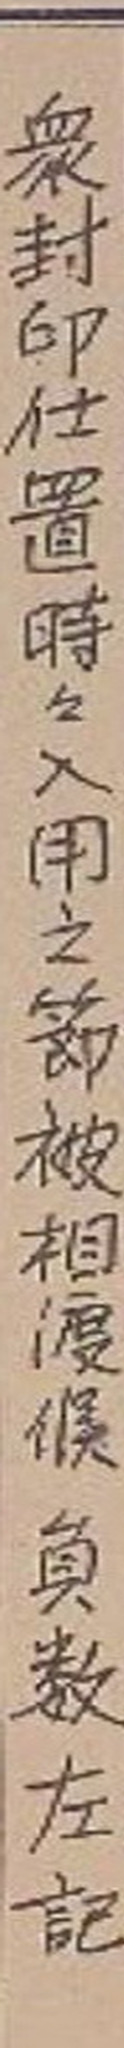衆封印仕置時々入用之節被相渡候員数左記
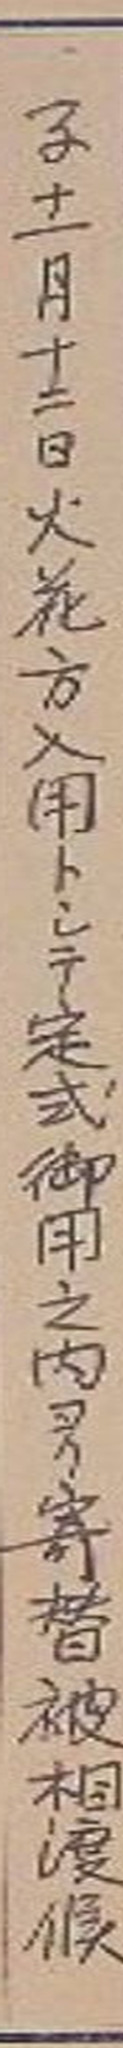子十一月十二日火花方入用として定式御用之内より寄替被相渡候
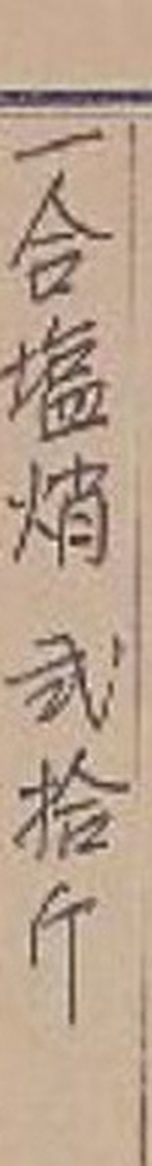一合塩硝弐拾斤
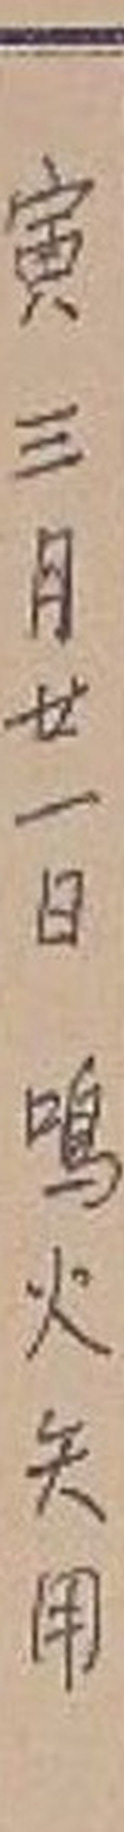寅三月廿一日鳴火矢用
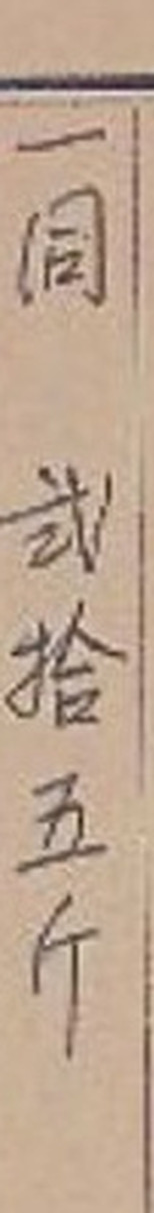一同弐拾五斤
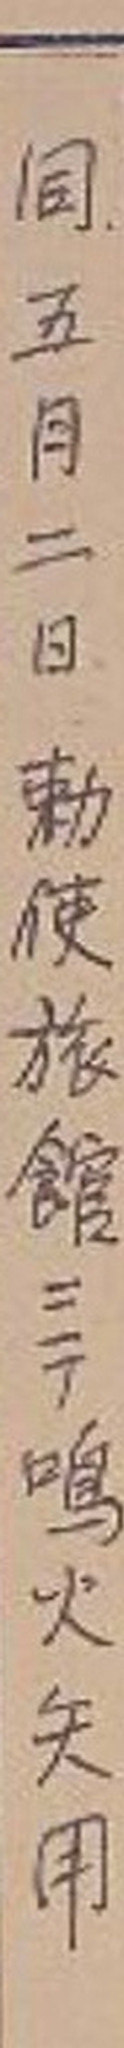同五月二日勅使旅館にて鳴火矢用
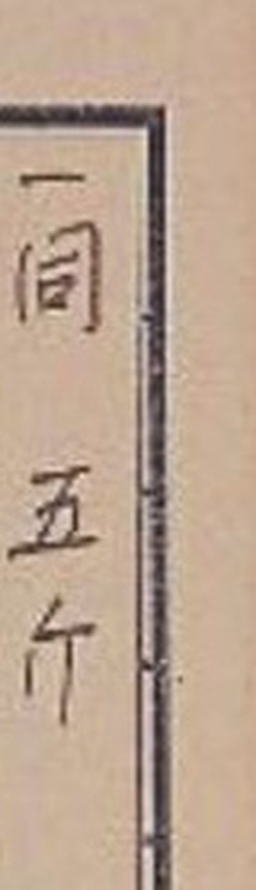一同五斤
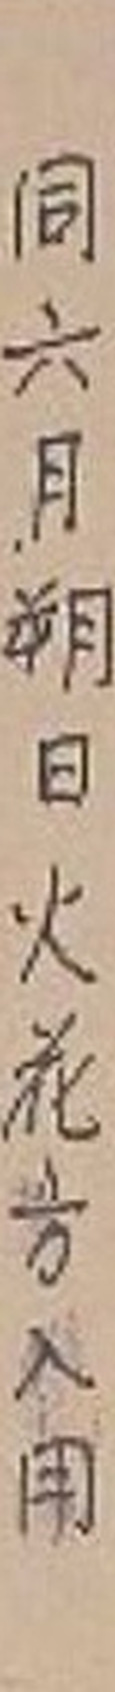同六月朔日火花方入用
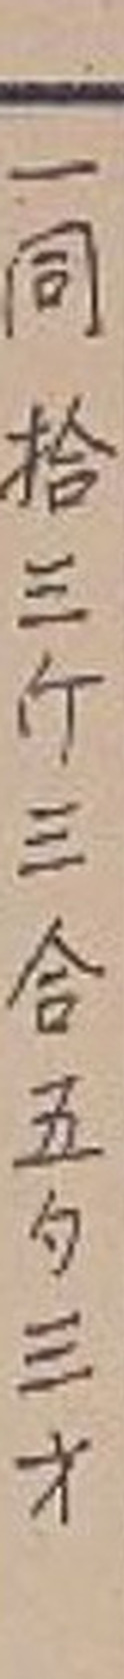一同拾三斤三合五勺三才
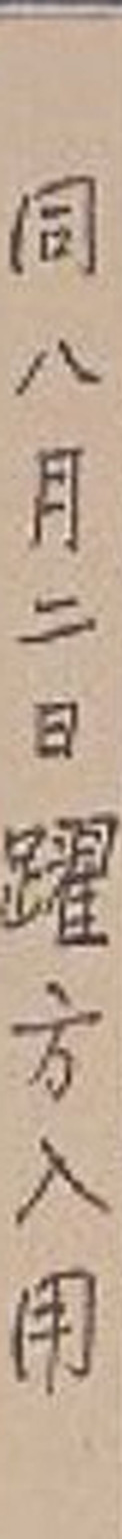同八月二日躍方入用
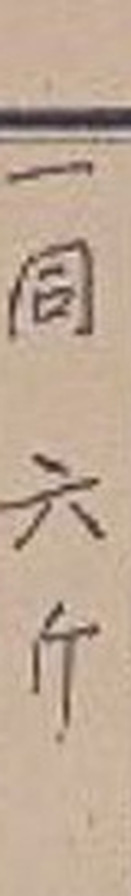一同六斤
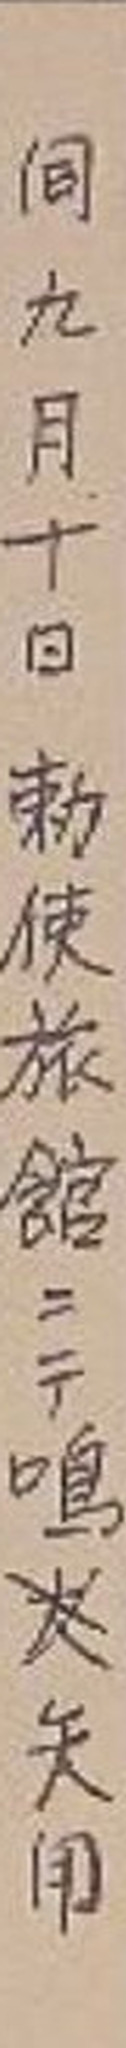同九月十日勅使旅館にて鳴火矢用
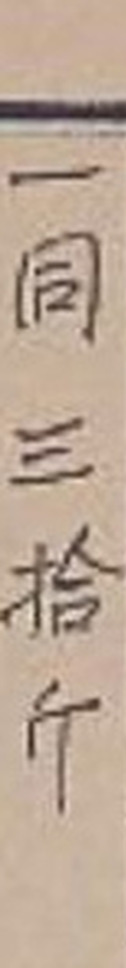一同三拾斤
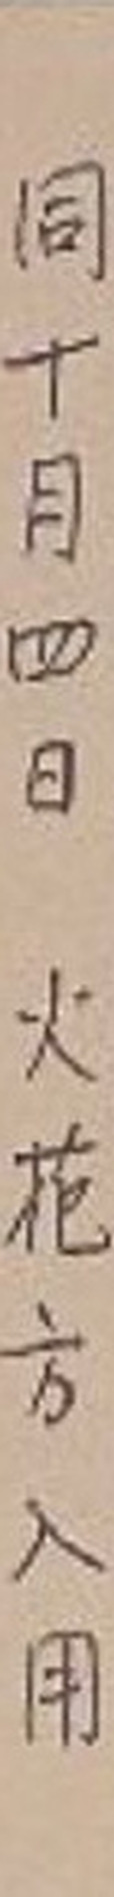同十月四日火花方入用
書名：支那冊封使来琉諸記 下巻
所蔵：University of the Ryukyus Library
